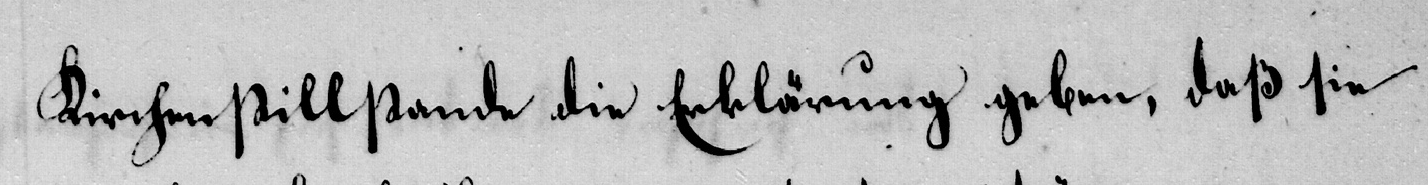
Kirchenstillsande die Erklärung geben, daß sie
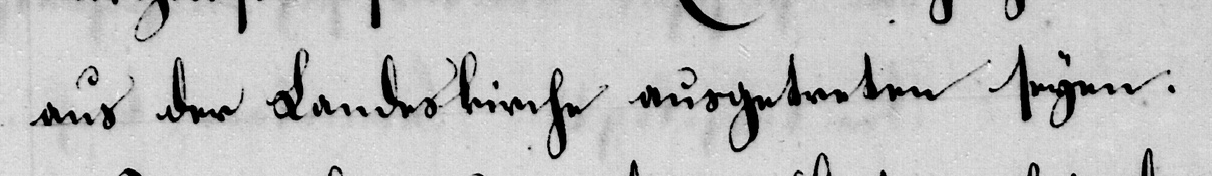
aus der Landeskirche ausgetreten seyen.
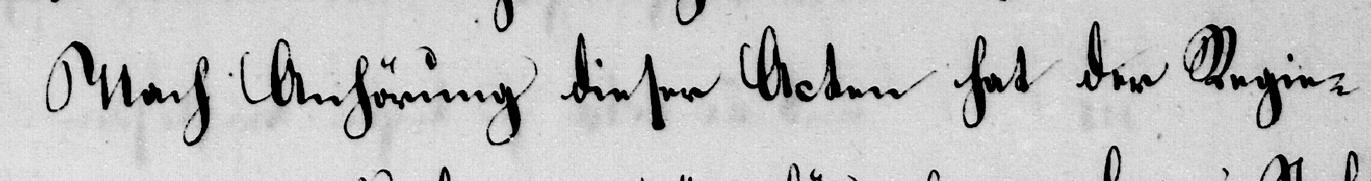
Nach Anhörung dieser Acten hat der Regie¬
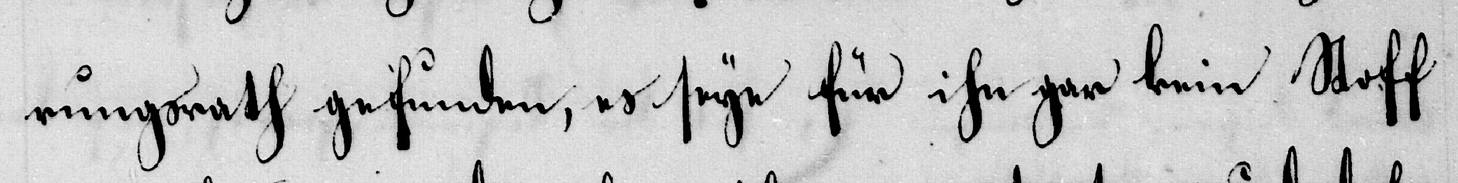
rungsrath gefunden, es seye für ihn gar kein Stoff
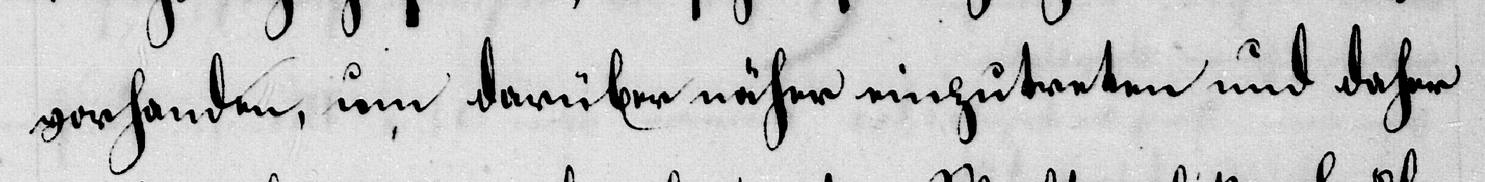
vorhanden, um darüber näher einzutreten und daher
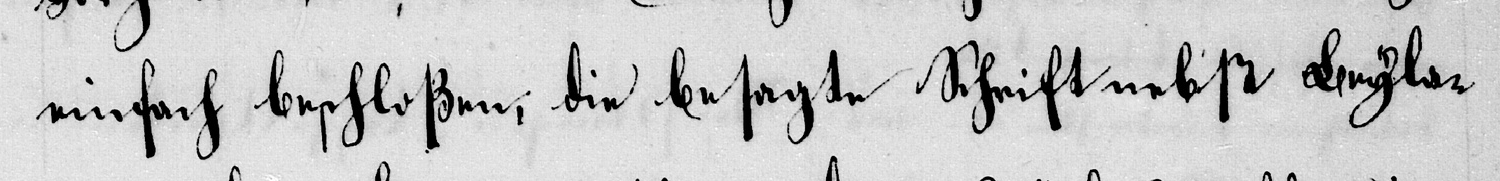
einfach beschloßen, die besagte Schrift nebst Beyla¬
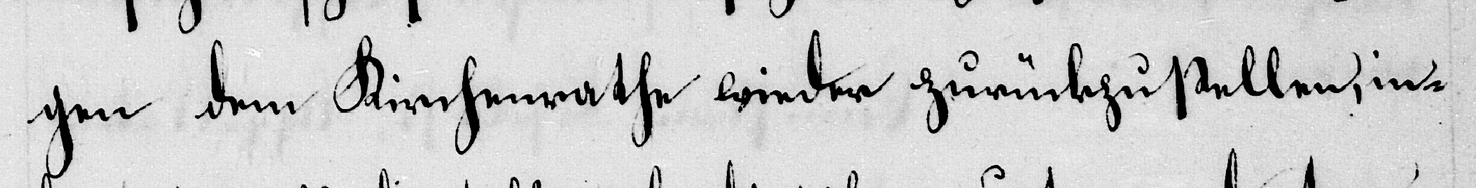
gen dem Kirchenrathe wieder zurückzustellen, in¬
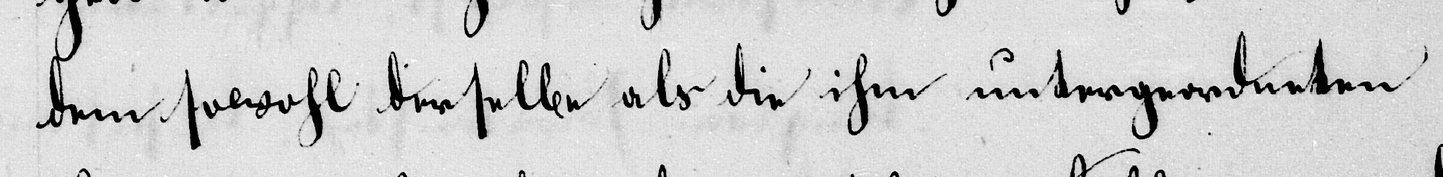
dem sowohl derselbe als die ihm untergeordneten
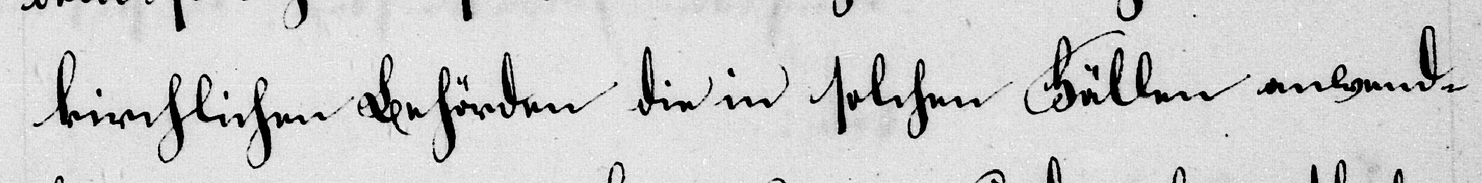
kirchlichen Behörden die in solchen Fällen anwend¬
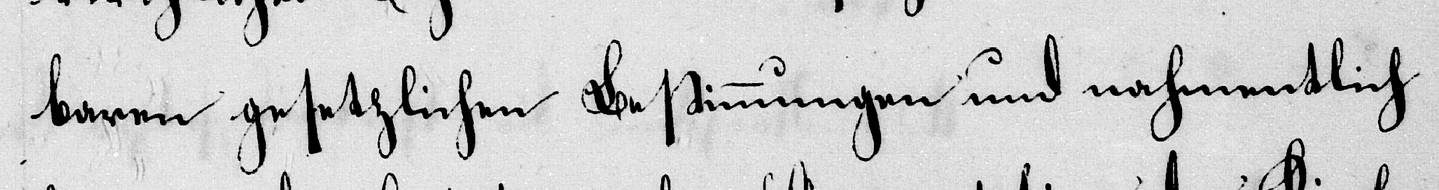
baren gesetzlichen Bestimmungen und nahmentlich
